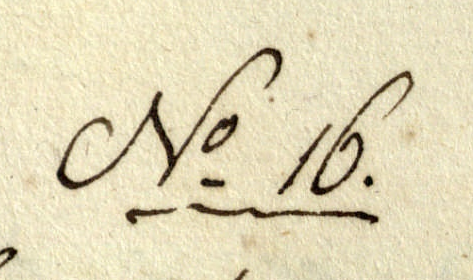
No 16.
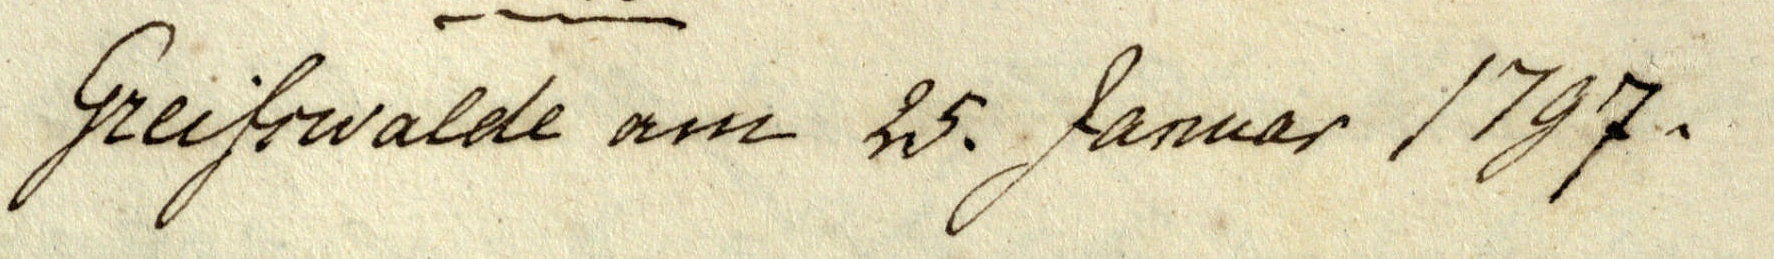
Greifswalde am 25. Januar 1797.
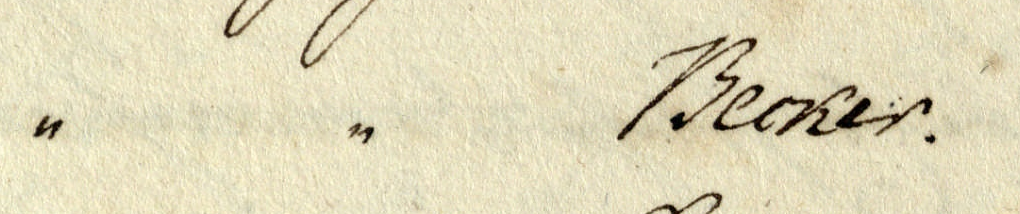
Becker.
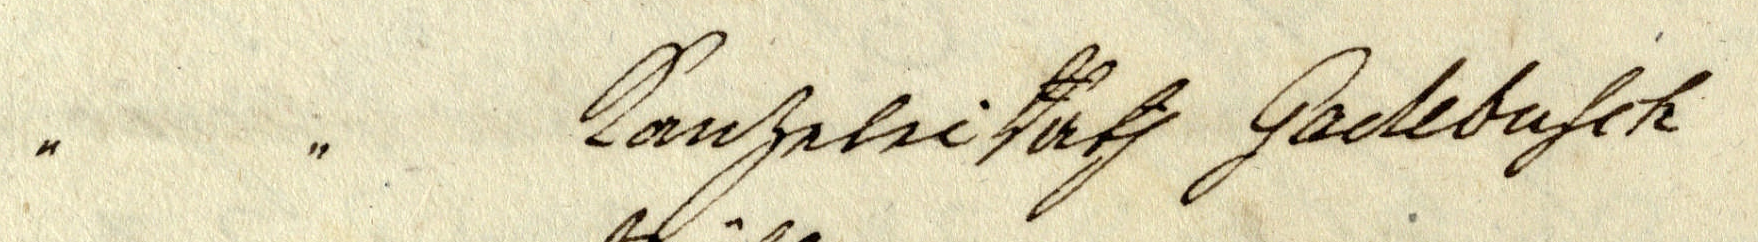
Kanzelei Rath Gadebusch
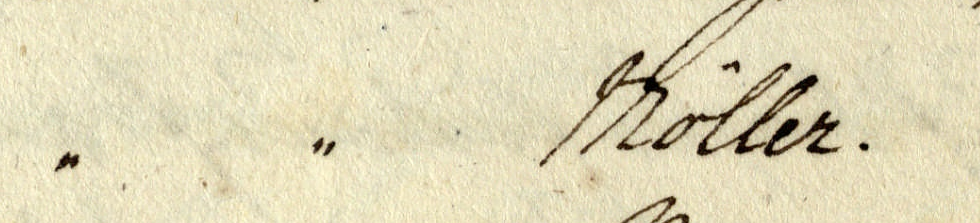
Möller.
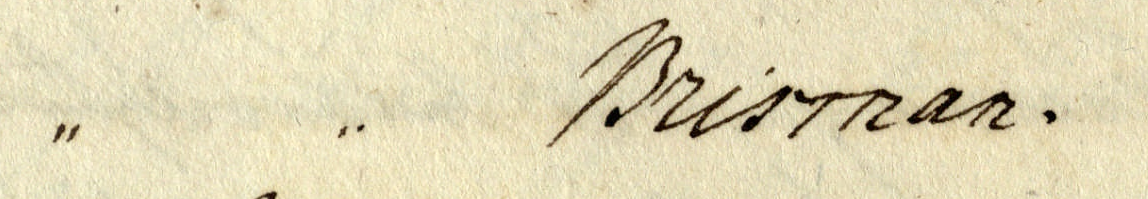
Brisman.
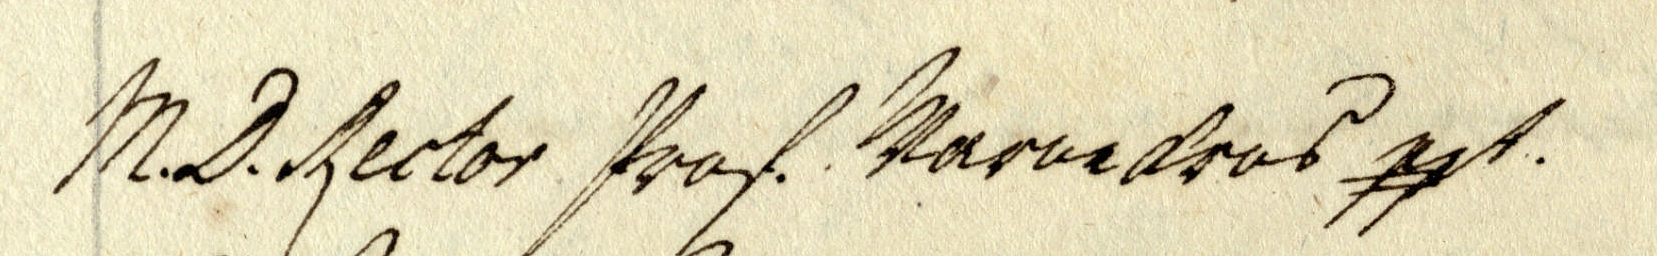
M. D. Rector Prof. Warnekros ppt.
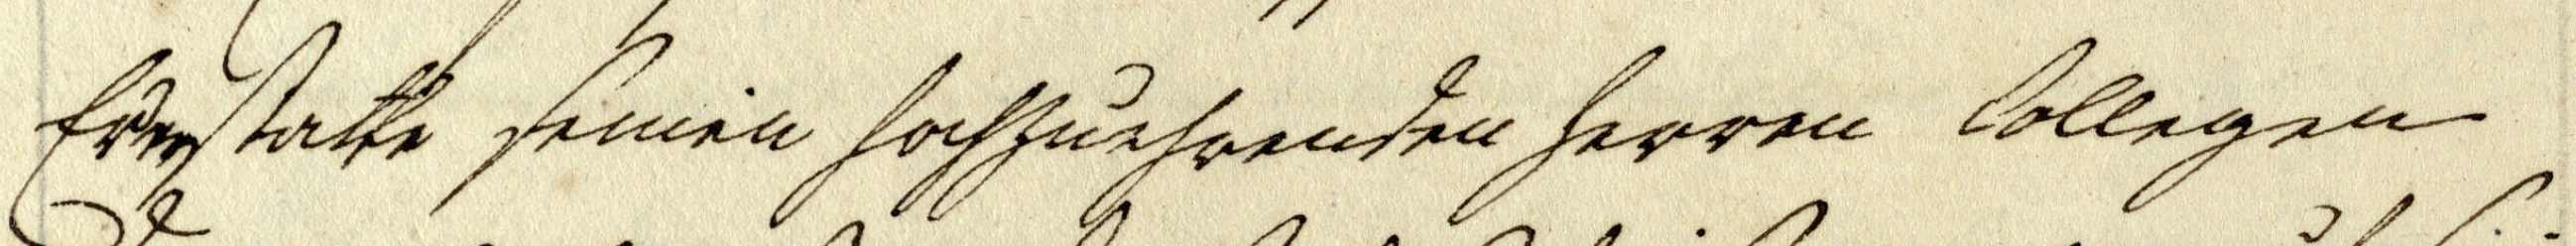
Er erstatte seinen hochzuehrenden Herren Collegen
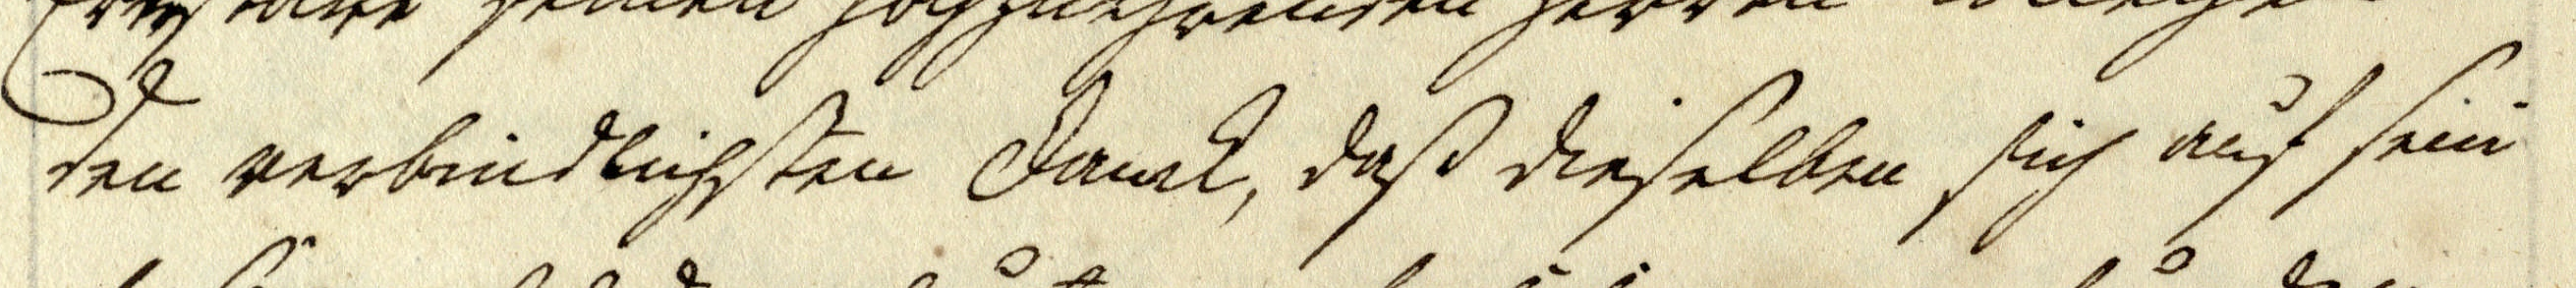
den verbindlichsten Danck, daß dieselben sich auf sein
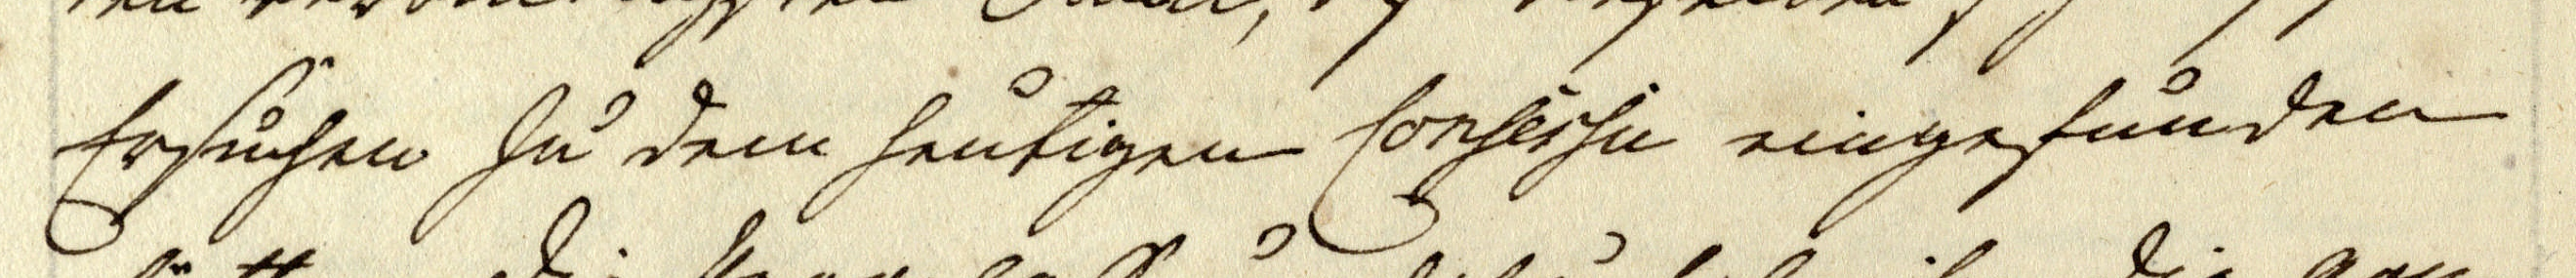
Ersuchen zu dem heutigen Consessu eingefunden
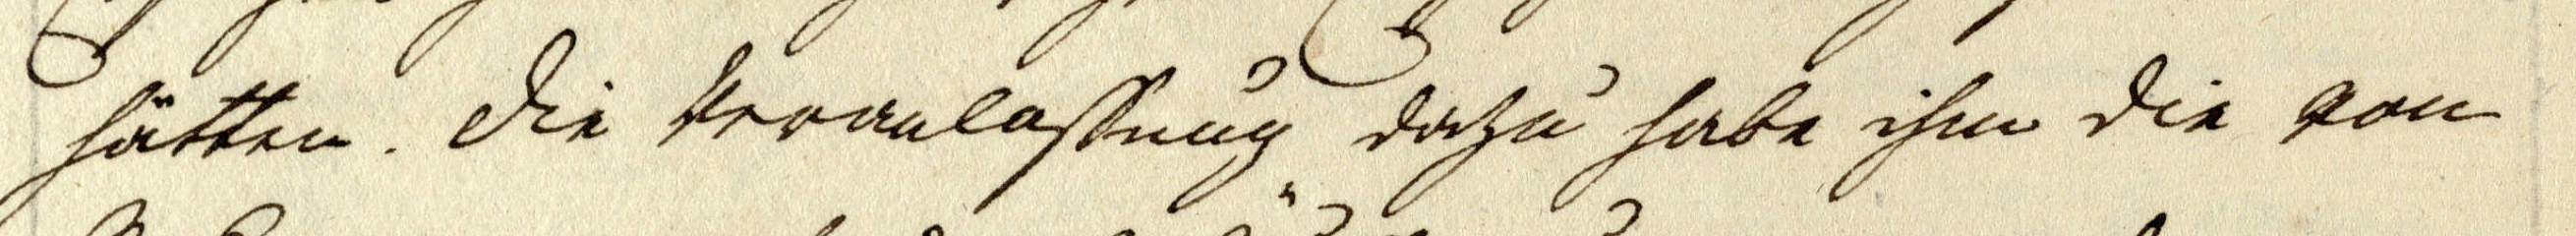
hätten. Die Veranlassung dazu habe ihm die von
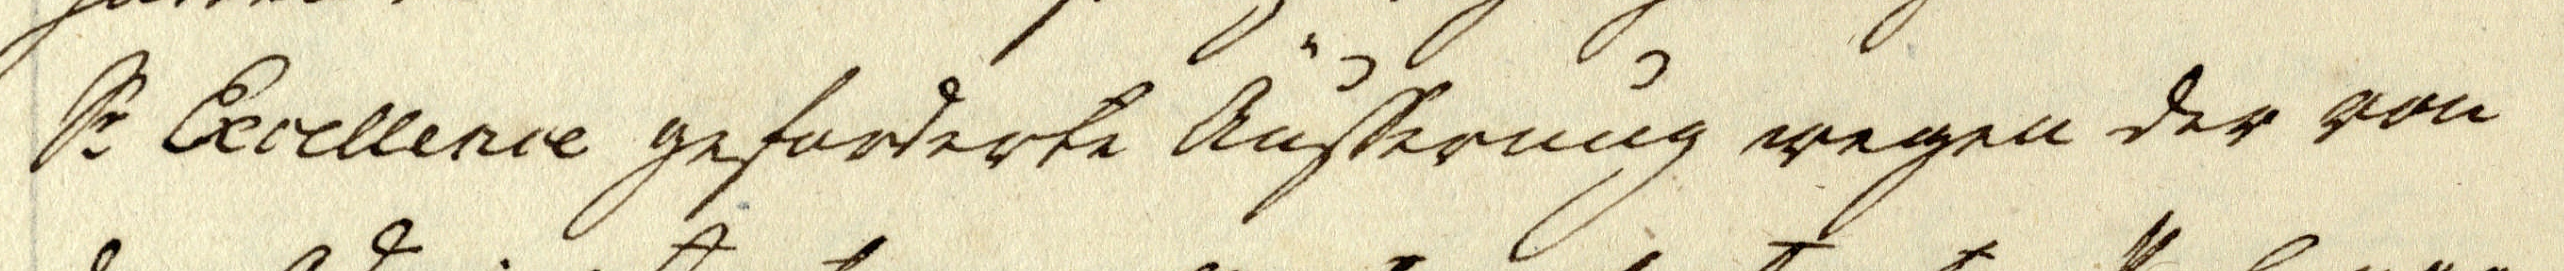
Sr Excellence geforderte Äusserung wegen der von
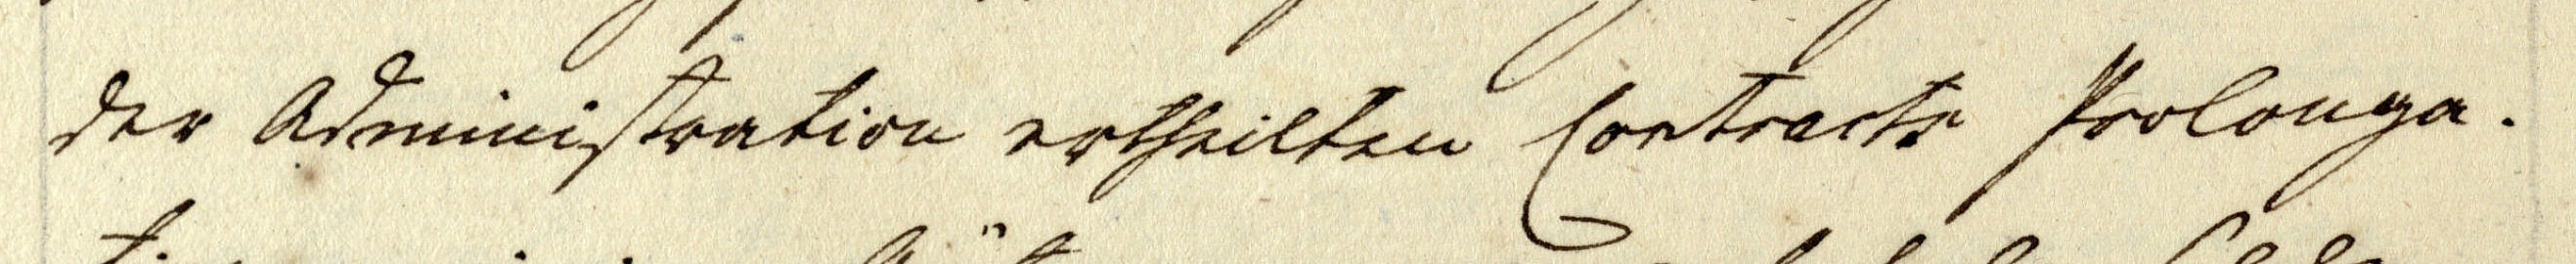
der Administration ertheilten Contracts Prolonga¬
